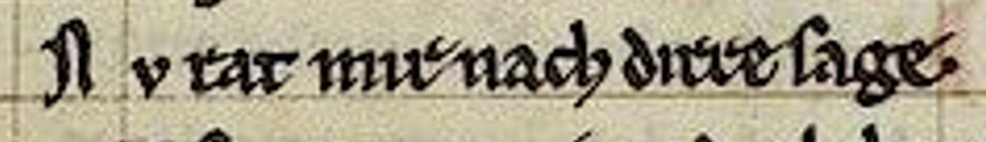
Nv rat mir nach dirre ſage.
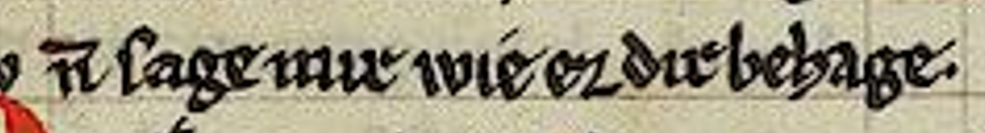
Vn(d) ſage mir wie ez dir behage.
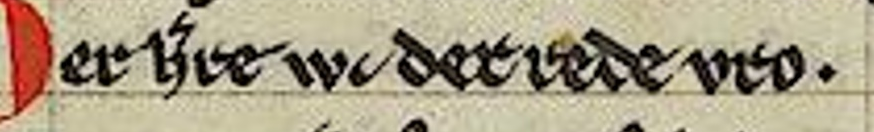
*Der h(er)re w(az) der rede vro.
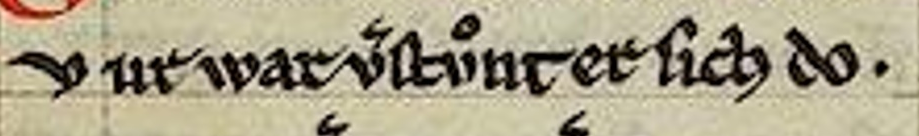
Vur war v(er)ſtv°ont er ſich do.
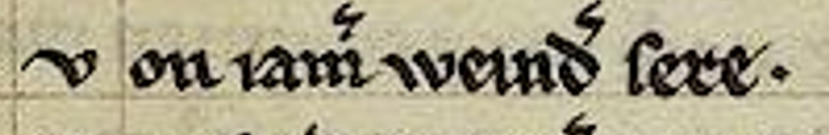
Von iam(er) weind(er) ſere.
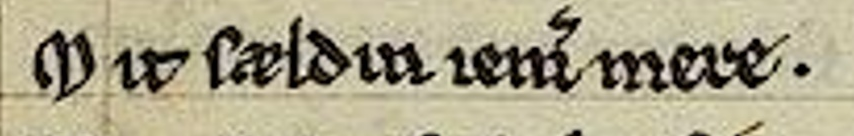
Mit ſ[ae]ldin iem(er) mere.
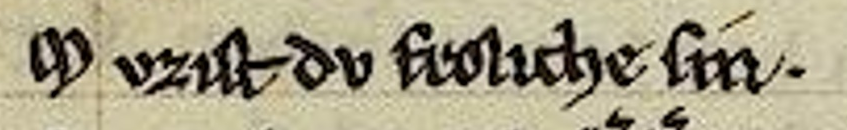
Mvziſt dv froliche ſin.
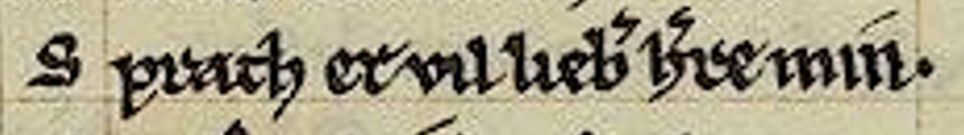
Sprach er vil lieb(er) h(er)re min.
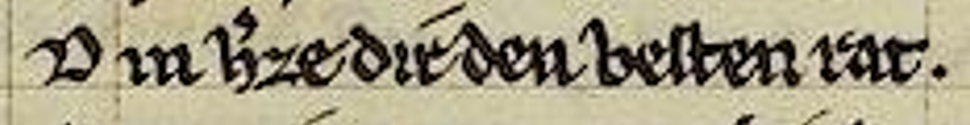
Din h(er)ze dir den beſten rat.
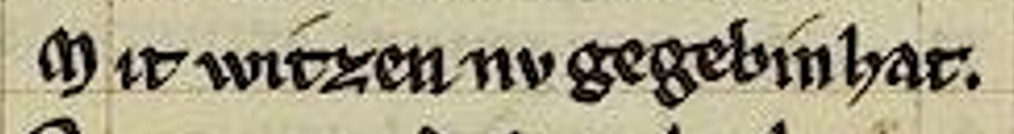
Mit witzen nv gegebin hat.
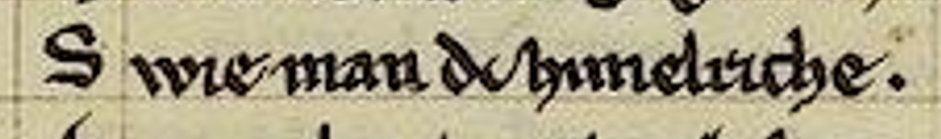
Swie man d(az) himelriche.
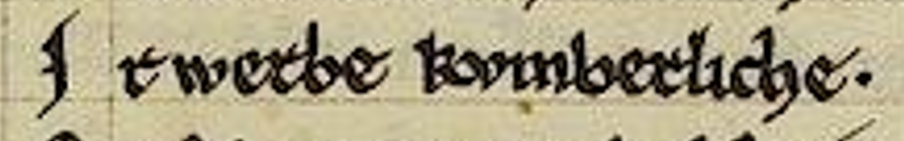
Irwerbe kvmberliche.
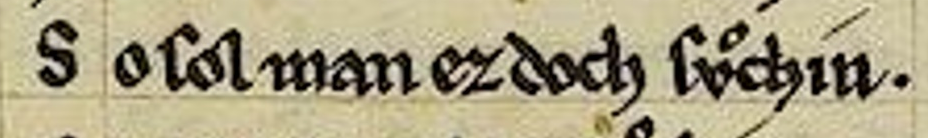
So ſol man ez doch ſv°ochin.
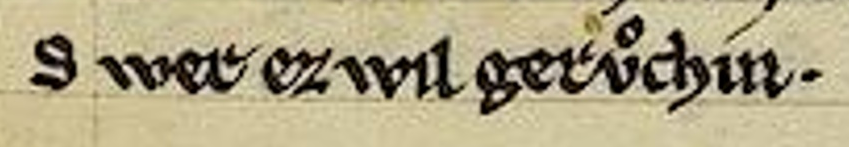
Swer ez wil gerv°ochin
